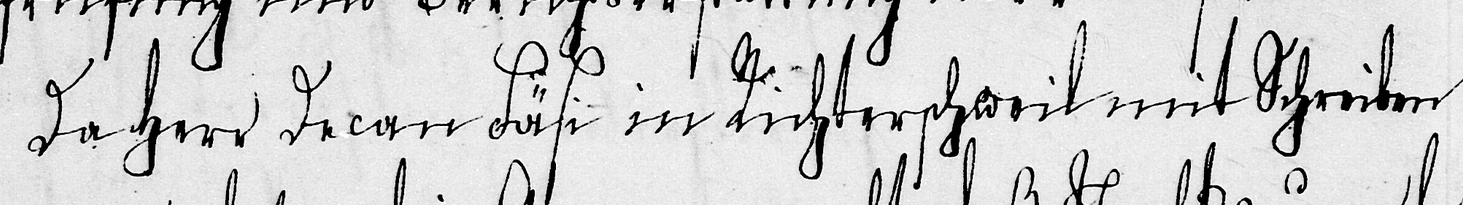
Da Herr Decan Fäsi in Richterschweil mit Schreiben
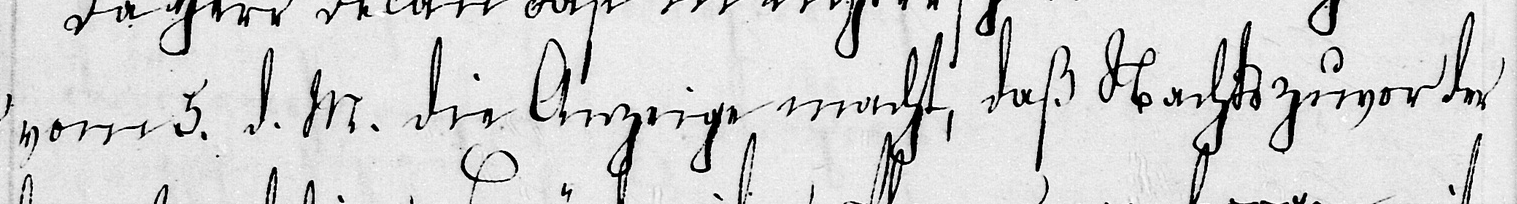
vom 5. d. M. die Anzeige macht, daß Nachts zuvor der
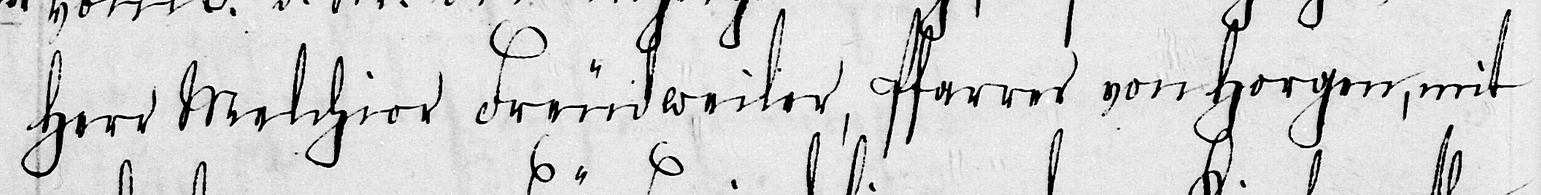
Herr Melchior Freudweiler, Pfarrer von Horgen, mit
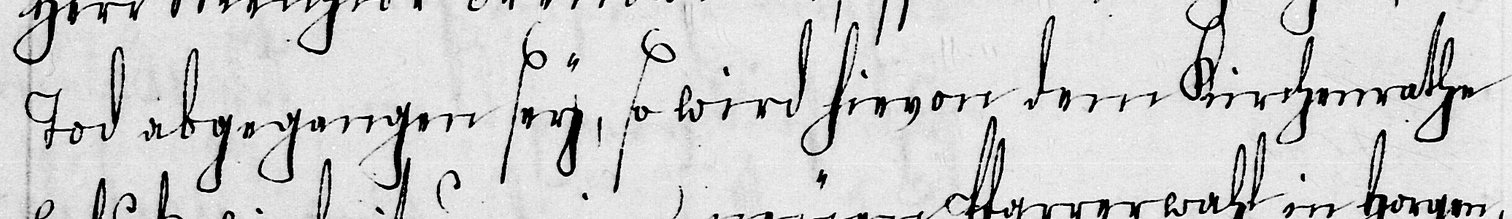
Tod abgegangen sey, so wird hievon dem Kirchenrathe
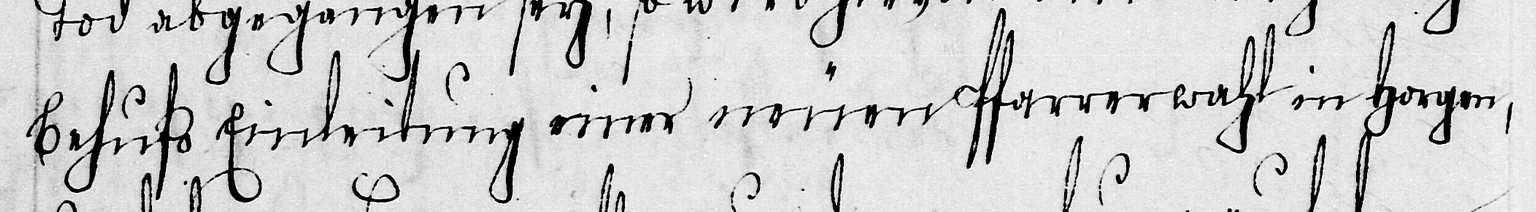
Behufs Einleitung einer neuen Pfarrerwahl in Horgen,
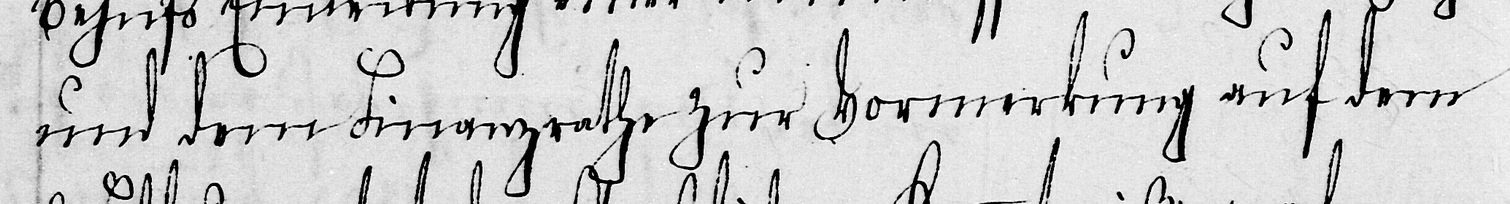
und dem Finanzrathe zur Vormerkung auf dem
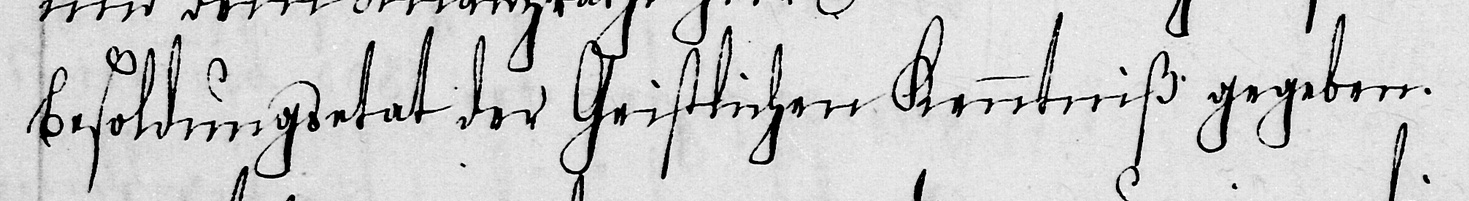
Besoldungsetat der Geistlichen Kenntniß gegeben.
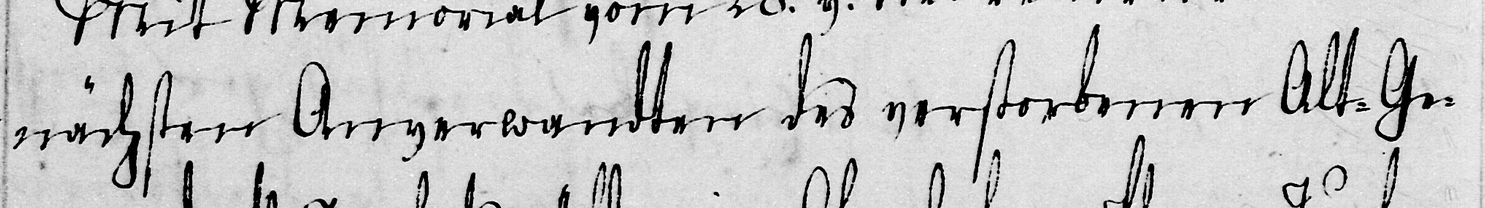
nächsten Anverwandten des verstorbenen Alt-Ge¬
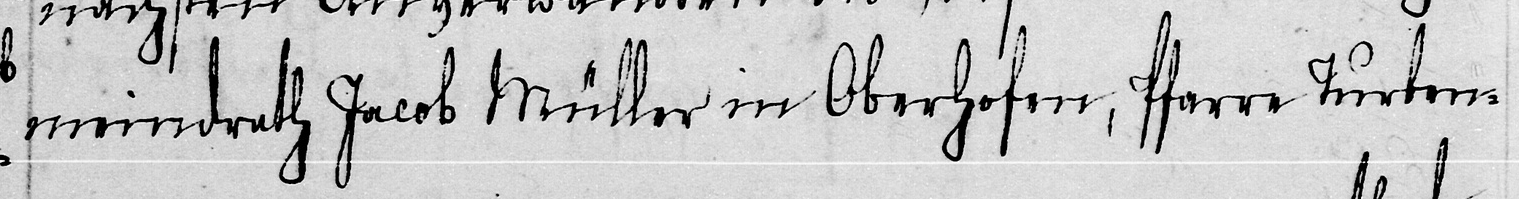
meindrath Jacob Müller in Oberhofen, Pfarre Turben-
